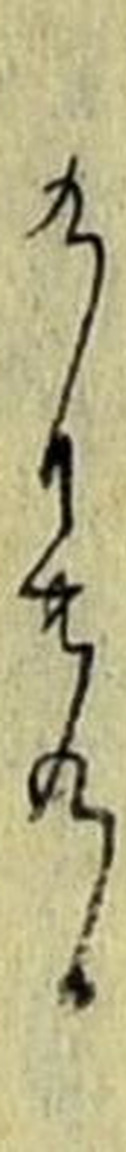九月廿九日
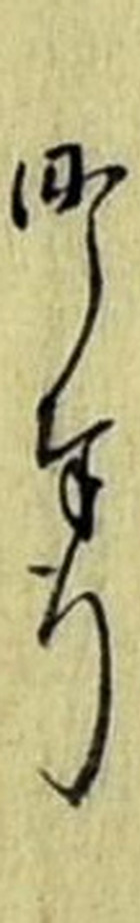御奉行
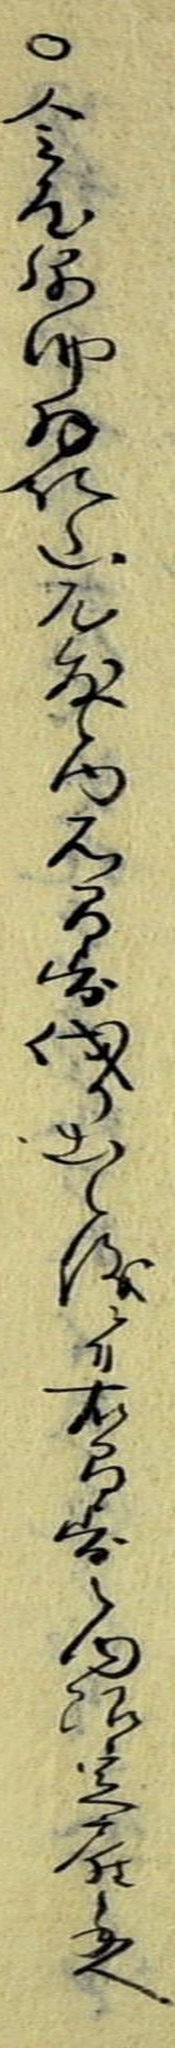○金屋弥助拝領山屋敷之内石間歩伐り出候儀に付右間歩之内限定雇手人

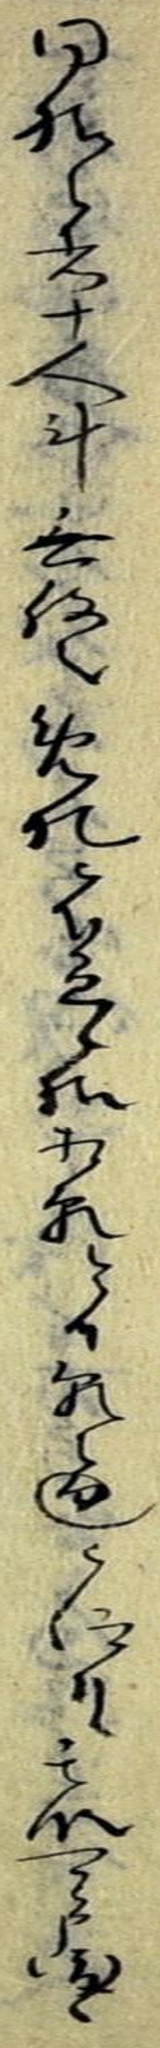同様之者十人斗無役之免札被下置候様相願候に付願之通被仰付候其段可被申渡候
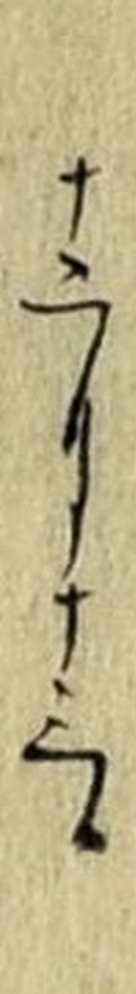十二月十三日
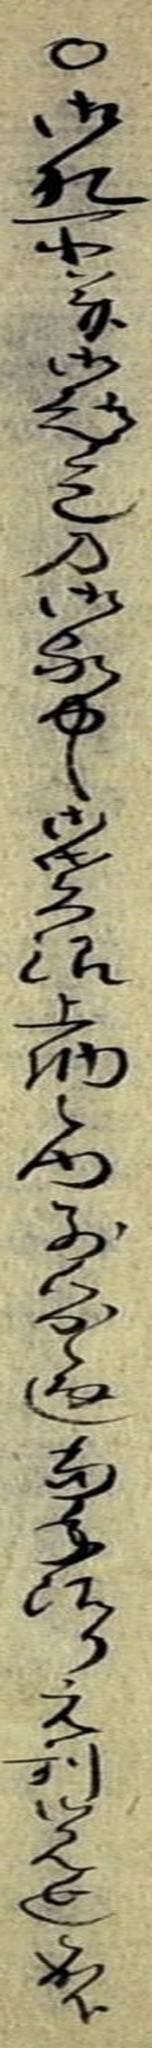○御札所并御趣意方御家中御貸銀上納之内別紙之通当年限り元利御見延被成下
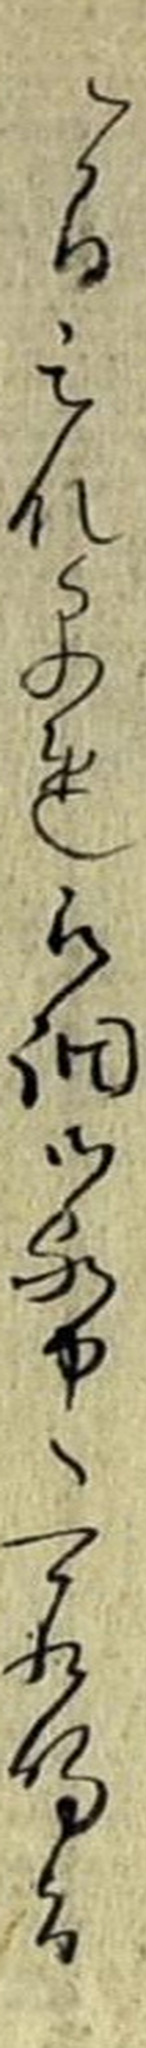候に付其段早速取調御家中へ可相触旨
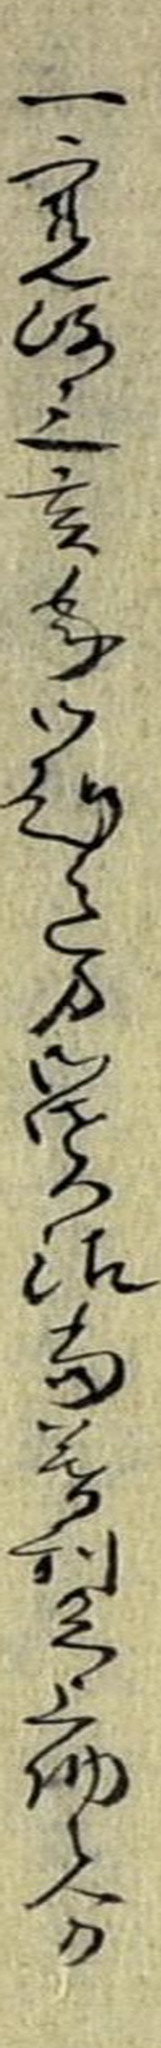一寛政三亥年御趣意方御貸銀当暮利足上納之分
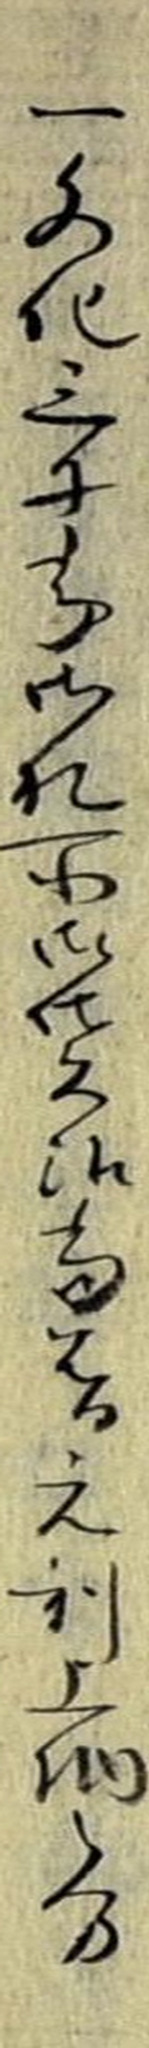一文化三子年御札所御貸銀当暮元利上納分
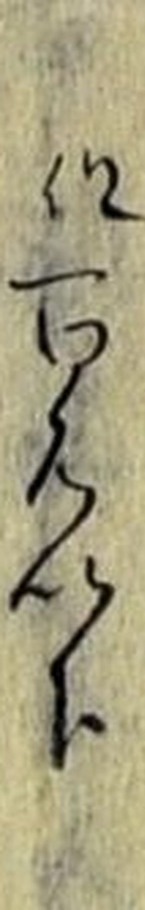但百石以下
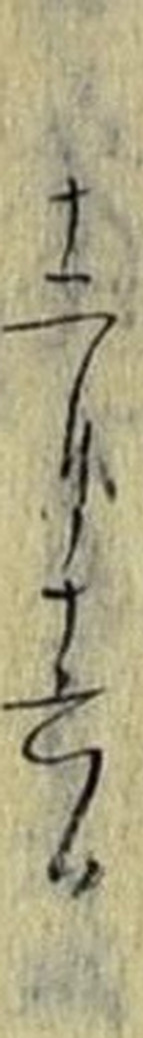十二月十六日
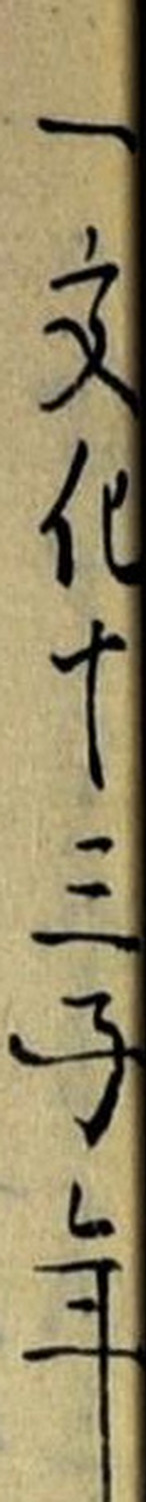一文化十三子年
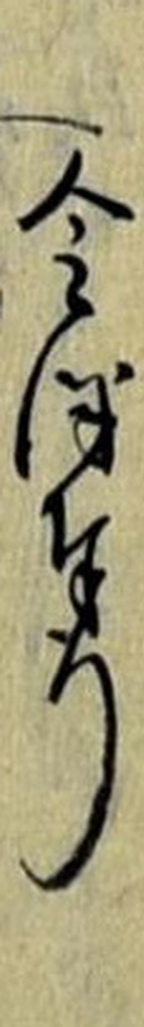金津奉行
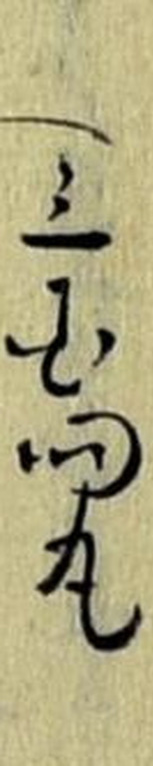三国問丸
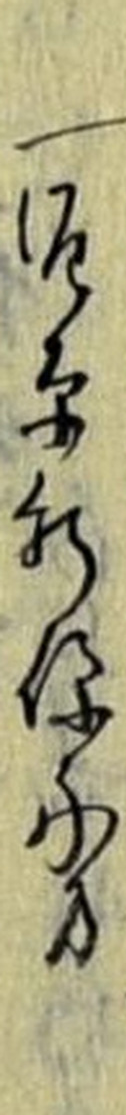泥原新保舟方へ
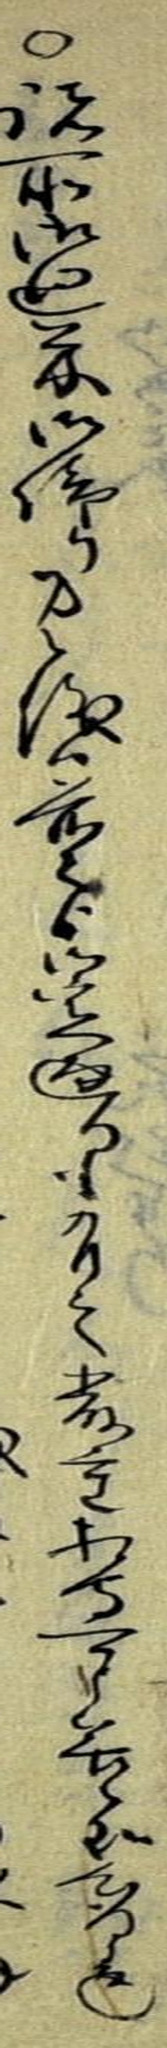○諸所御廻米御締り方之儀は前々ゟ御定通りも有之厳重相守可申筈之処心得違
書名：命令之部 四
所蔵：福井県文書館 Fukui Prefectural Archives
